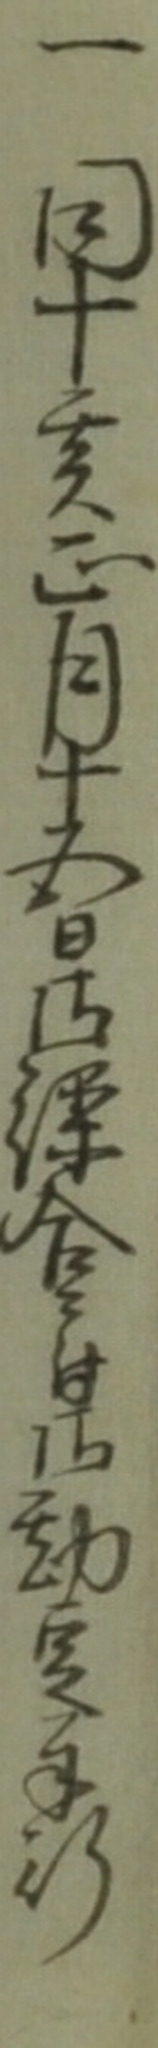一同十亥正月十五日御繰合ニ付御勘定奉行
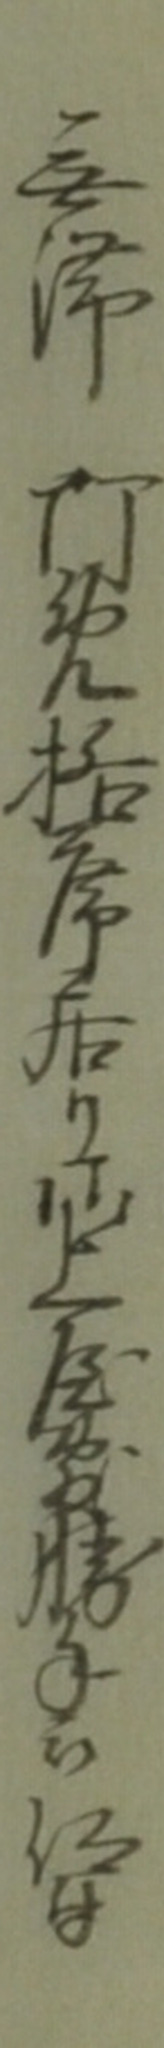無滞御免格席居り御上屋敷勝手被仰付
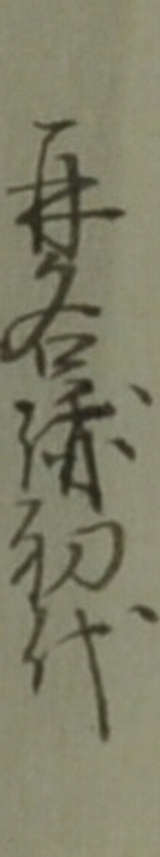再名跡初代
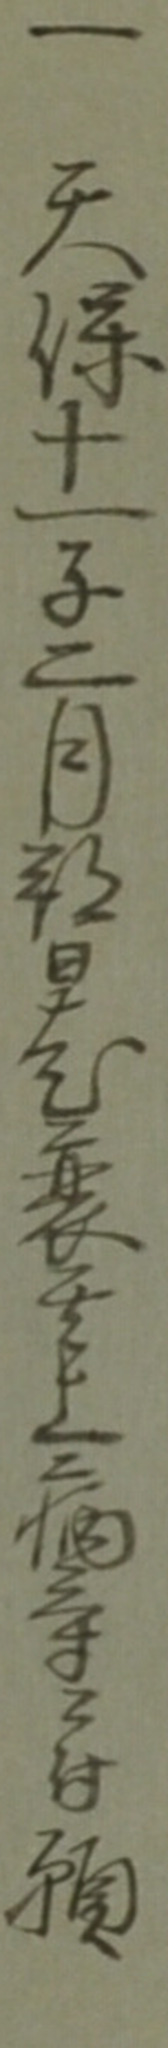一天保十一子二月朔日老衰其上病気ニ付願
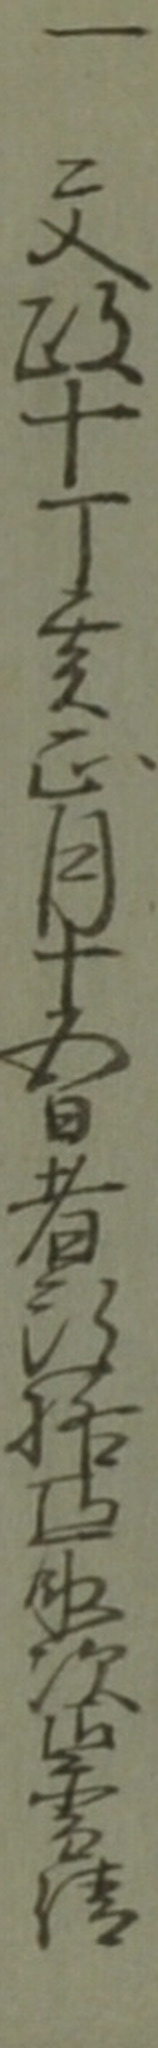一文政十丁亥正月十五日者頭格御取次御普請
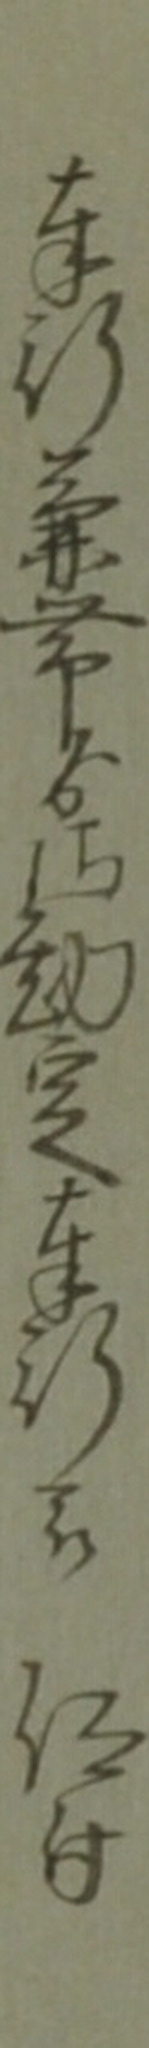奉行兼帯ゟ御勘定奉行被仰付
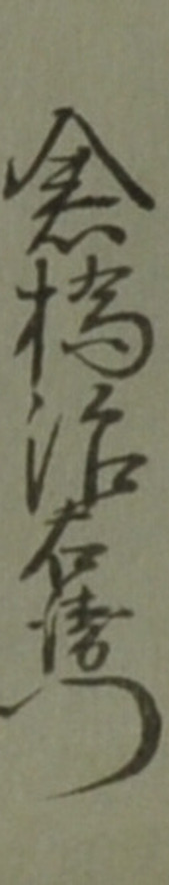倉橋治右衛門
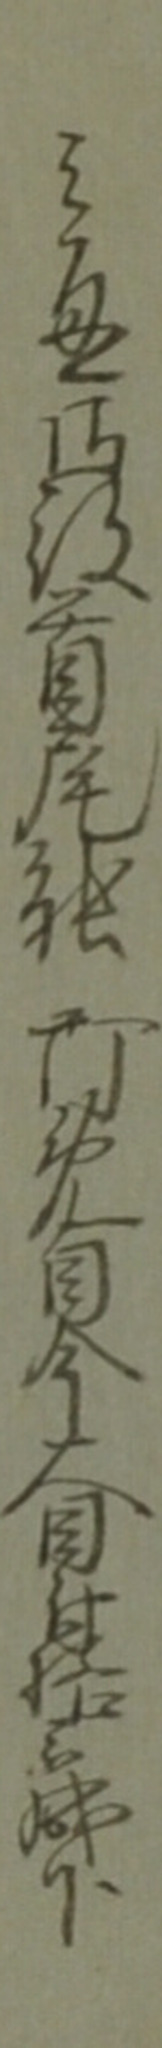之通御役首尾能御免自今大目付格被成下
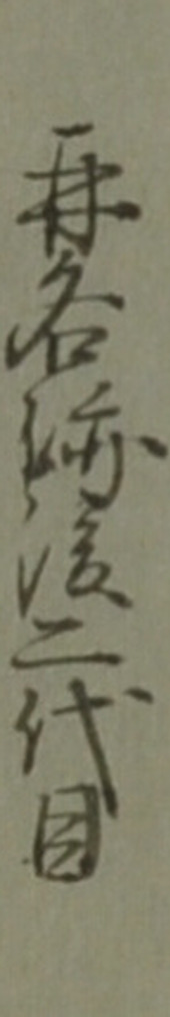再名跡後二代目
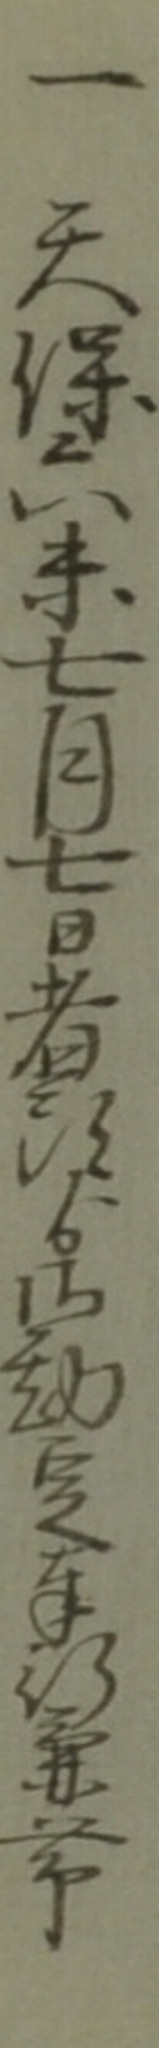一天保六未七月七日者頭ゟ御勘定奉行兼帯
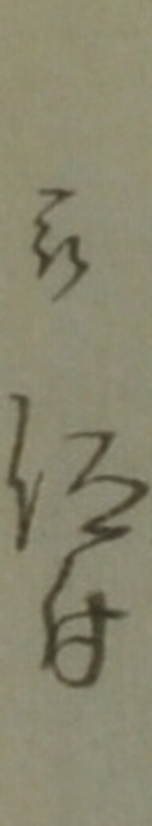被仰付
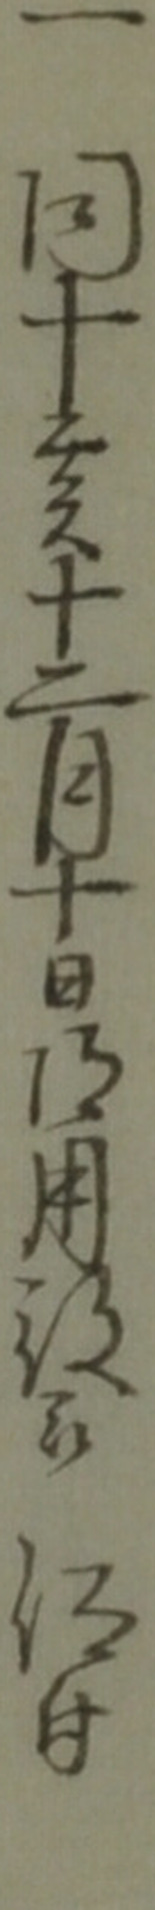一同十亥十二月十日御用役被仰付
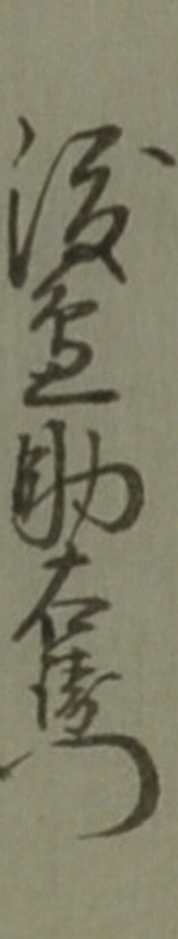渡邊助右衛門
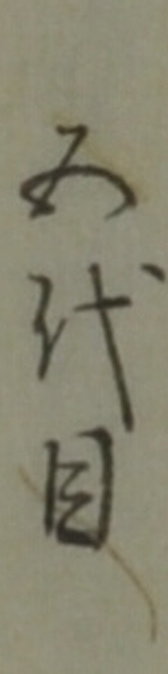五代目
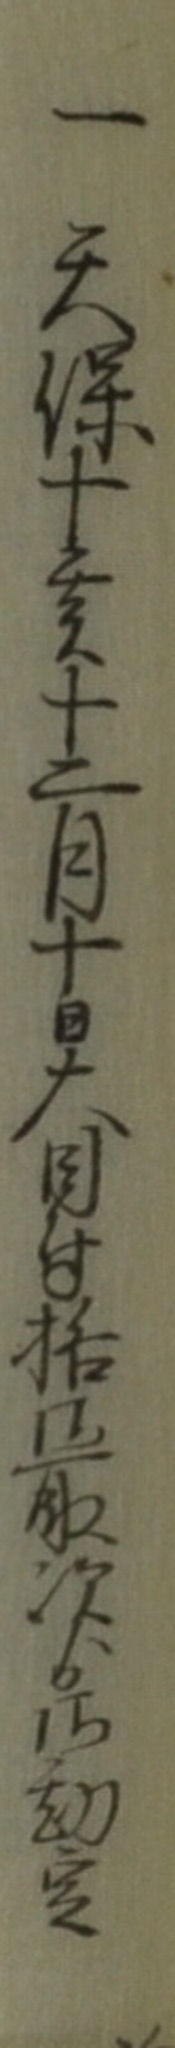一天保十亥十二月十日大目付格御取次ゟ御勘定
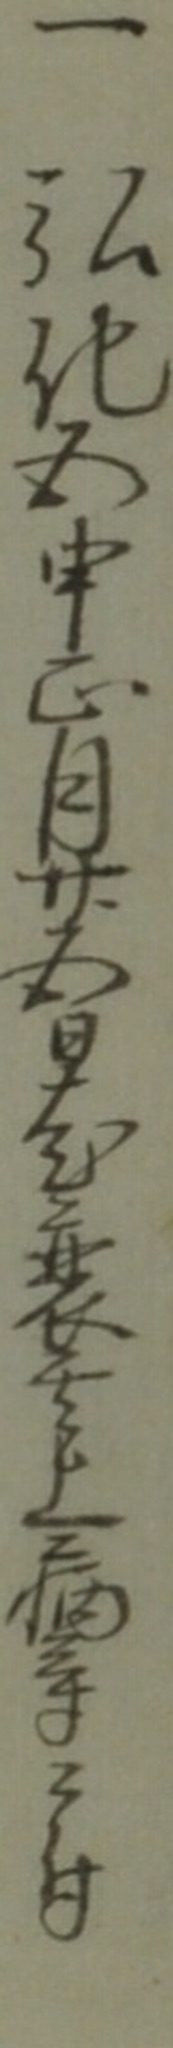一弘化五申正月廿五日老衰其上病気ニ付
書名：諸御役代々録（三）
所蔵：伊那市立高遠町図書館・合同会社AMANE
